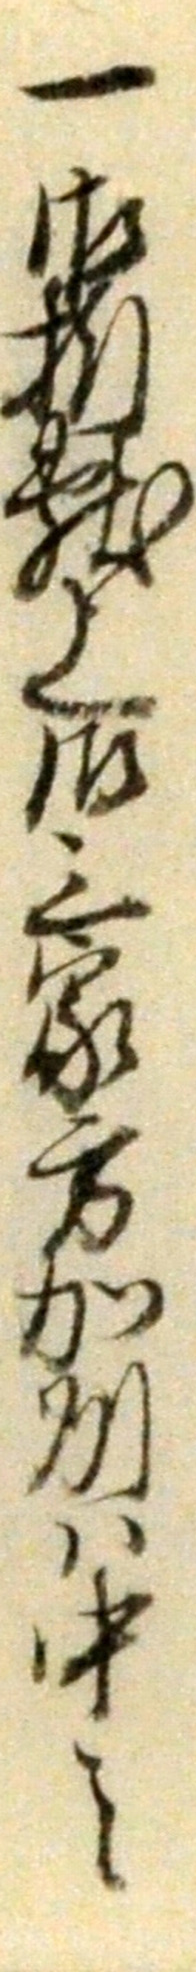一御折献上御三家方加州ハ中之
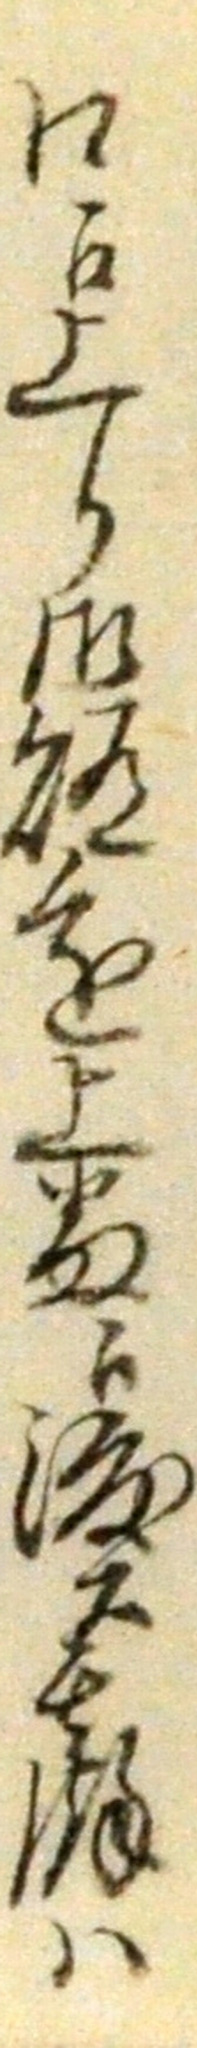口え上り御賄進上番え渡ス其余ハ
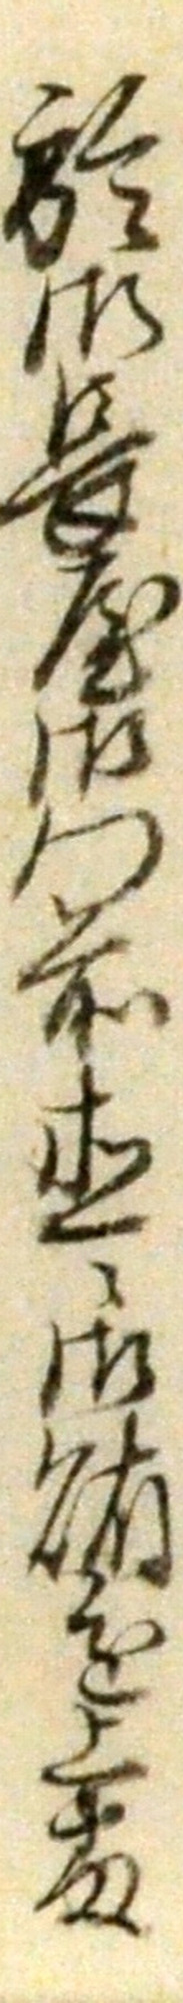於御長屋御門前直ニ御賄進上番
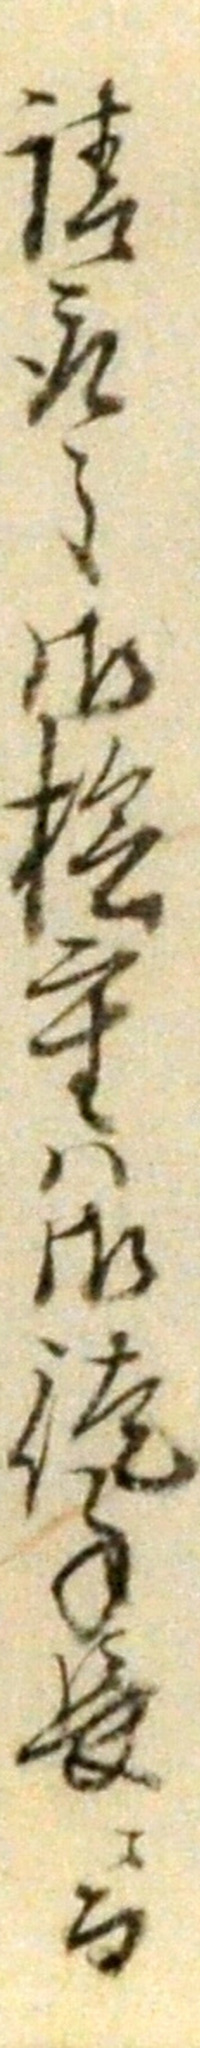請取之御桧重ハ御徒手長ニ而
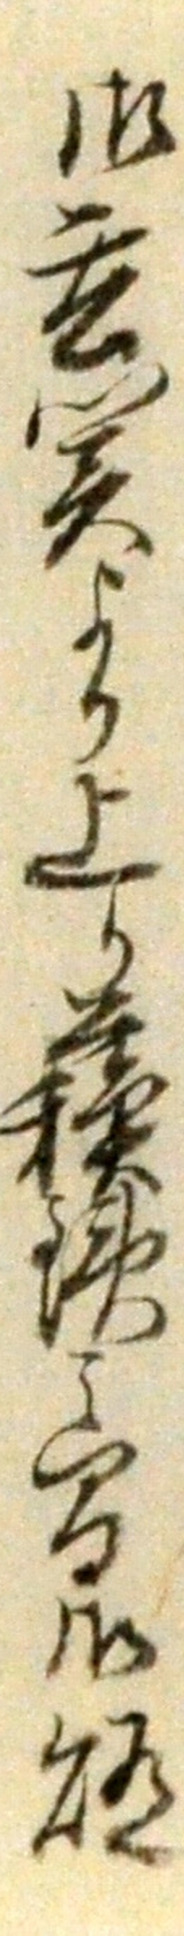御玄関より上り蘇鉄之間御賄
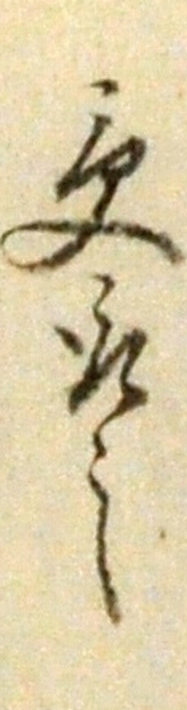受取之
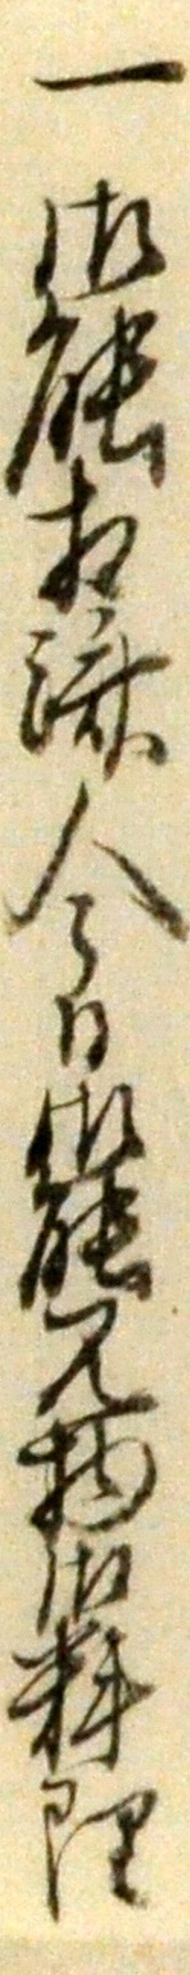一御能相済今日御能見物御料理
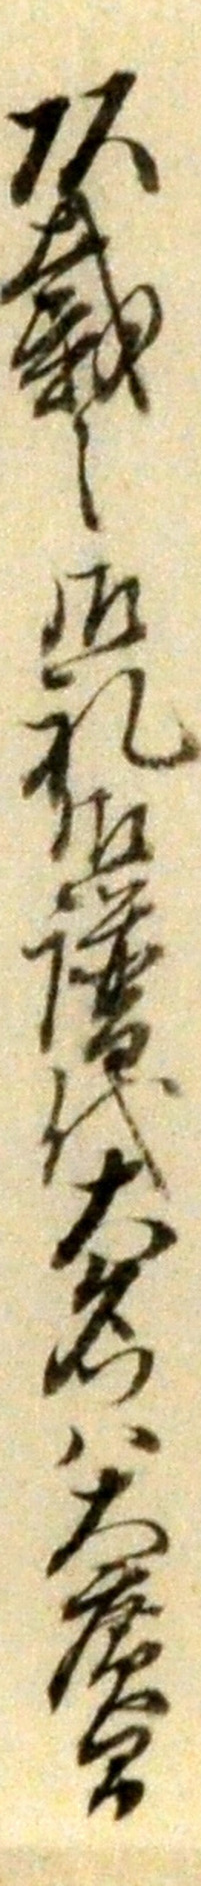頂戴之御礼御譜代大名ハ大広間
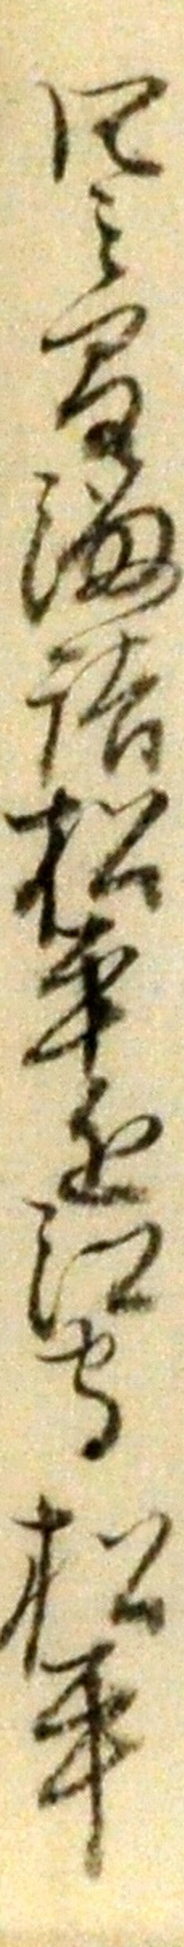四之間溜詰松平近江守松平
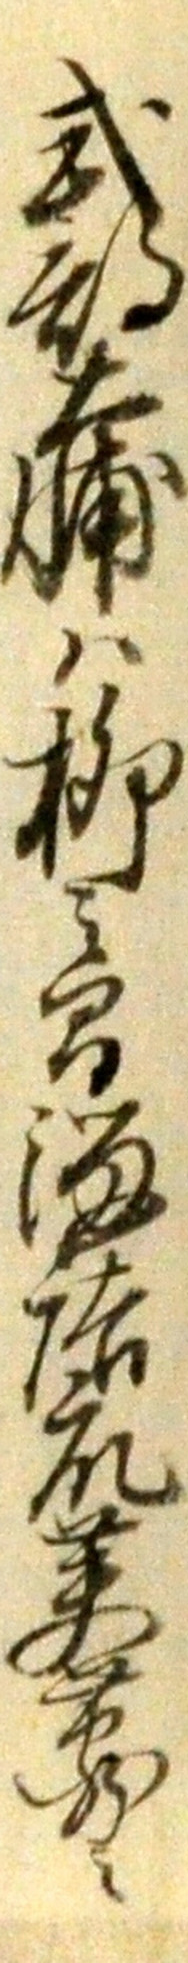式部大輔ハ柳之間溜詰衆芙蓉之
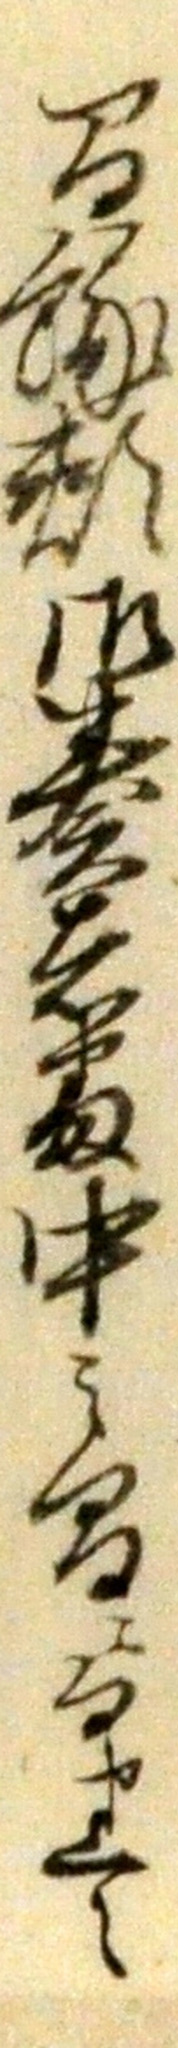間縁頬御奏者番中之間ニ而申上之
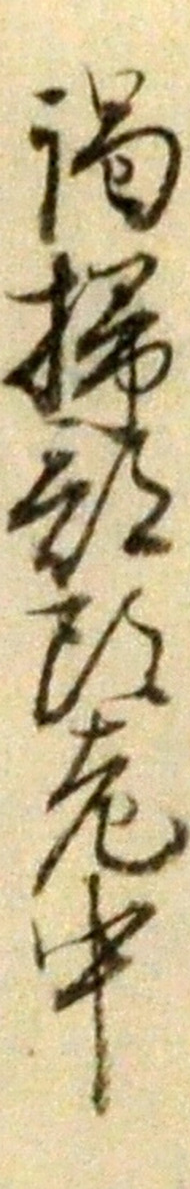謁掃部頭老中
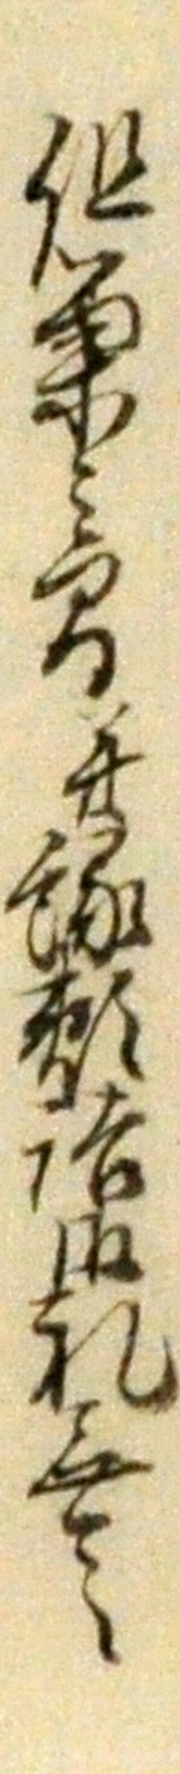但菊之間并縁頬詰御礼無之
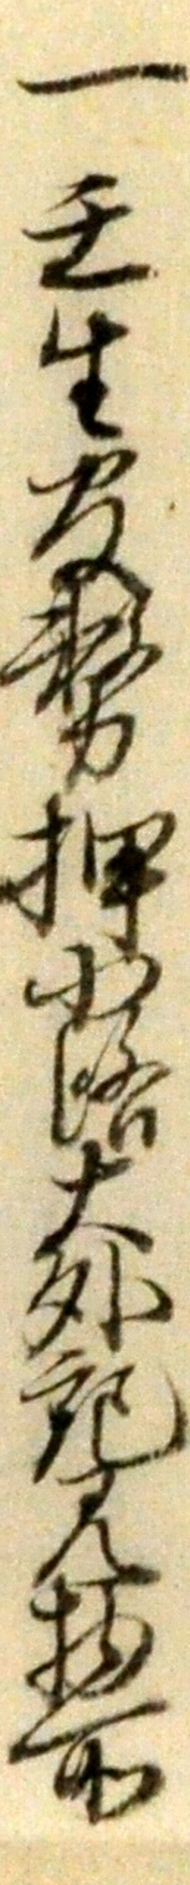一壬生官務押小路大外記見物所
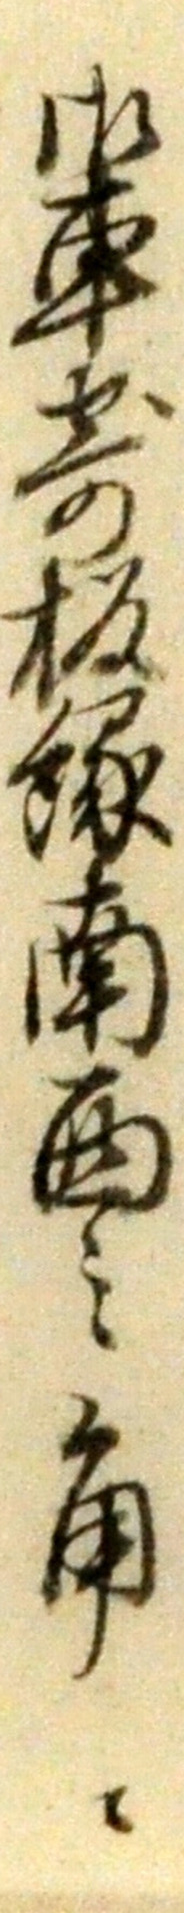御車寄板縁南西之角ニ
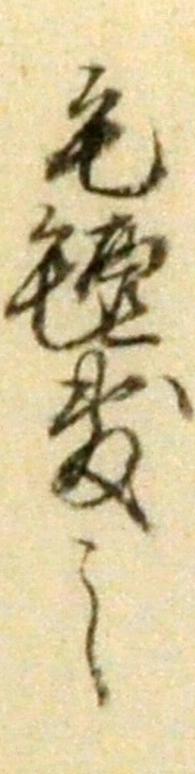毛氈敷之
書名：御馳走御能ノ節ノ留外
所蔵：伊那市立高遠町図書館・合同会社AMANE
